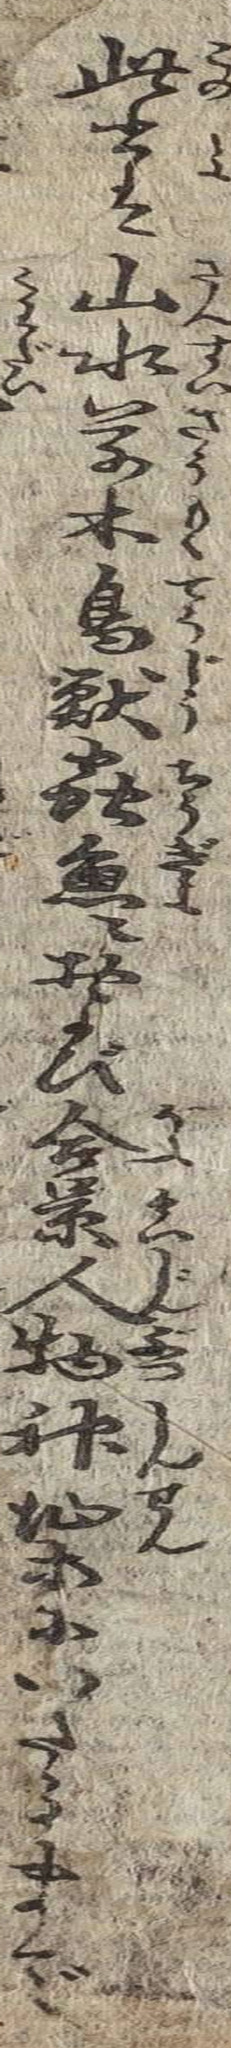此書は山水草木鳥獣てうじう）虫魚におよび合景人物神仙等にいたるまで
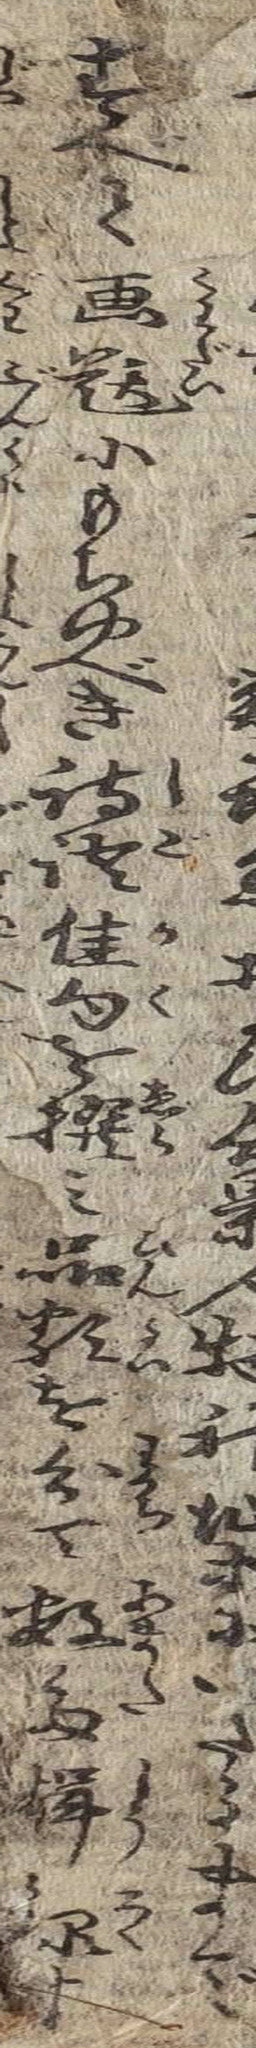すべて画題にもちゆべき詩語佳句を撰み品類を分て数多輯録
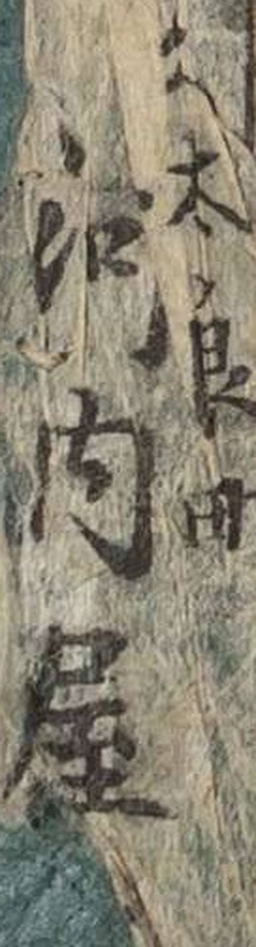河内屋
